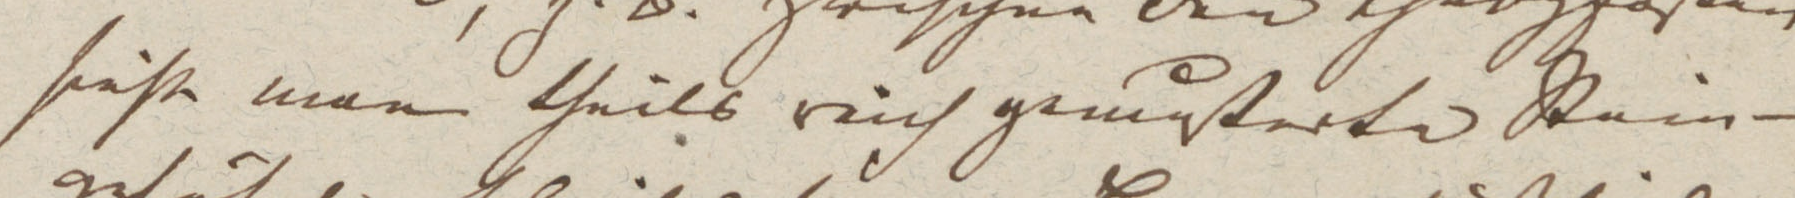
sieht man theils reich gemusterte Stein-
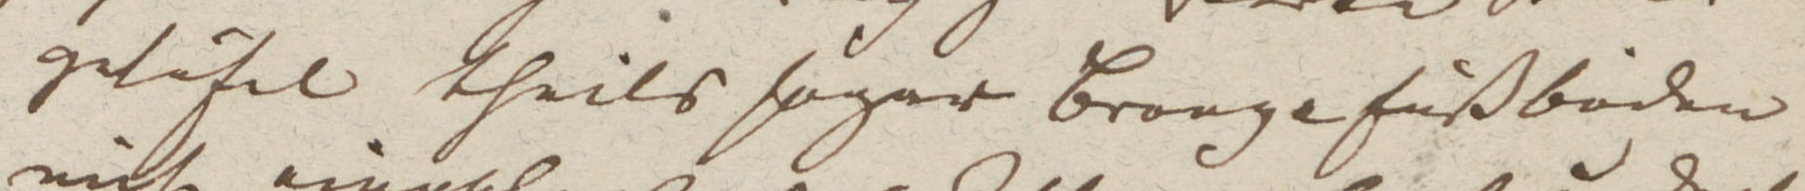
getäfel theils sogar Bronzefussböden
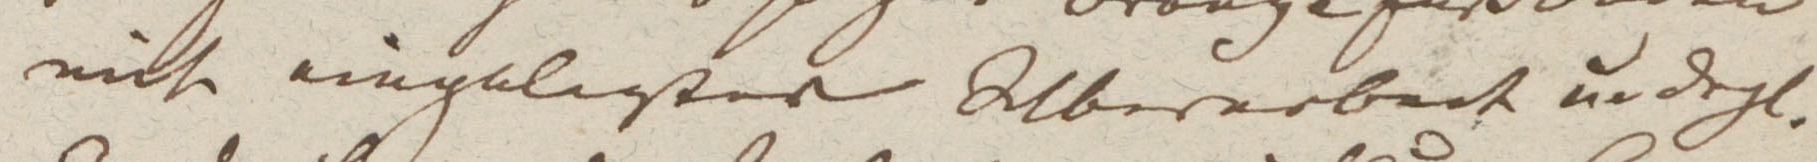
mit eingelegter Silberarbeit u. drgl.
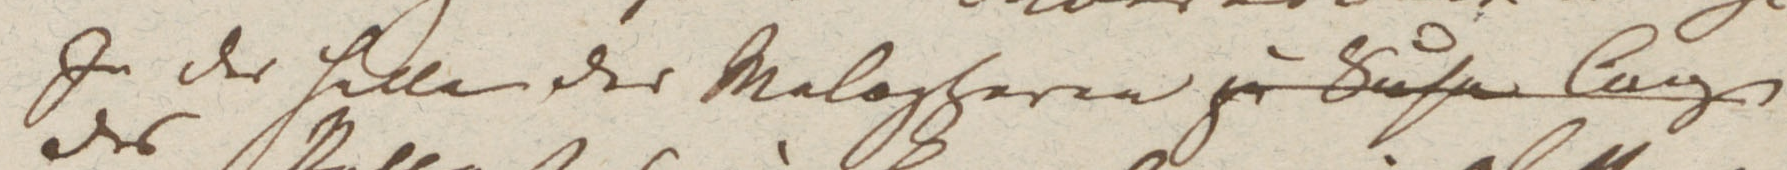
In der Halle der Melophoren zu Susa lag
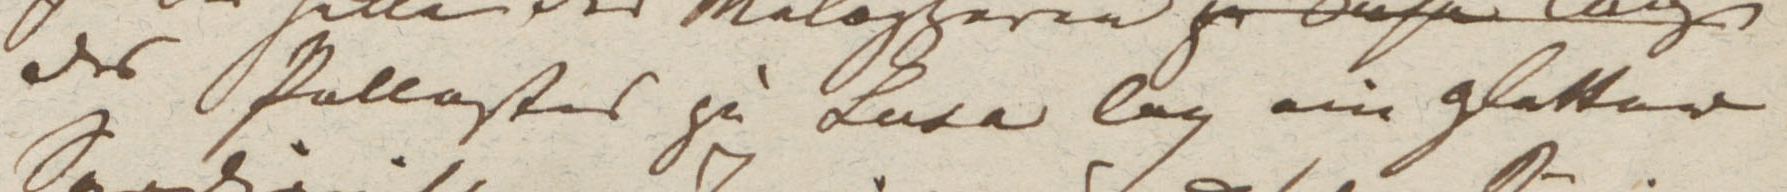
des Pallastes zu Susa lag ein glatter
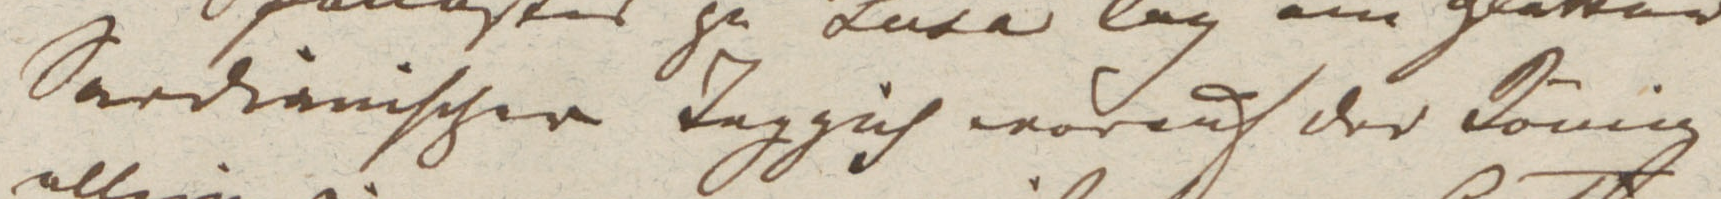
Sardianischer Teppich worauf der König
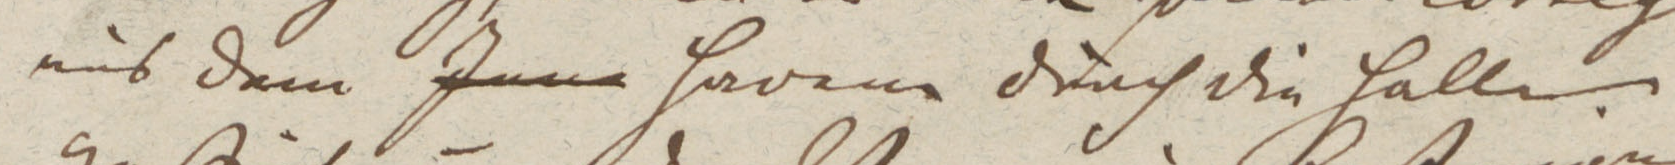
aus dem Harem durch die Halle
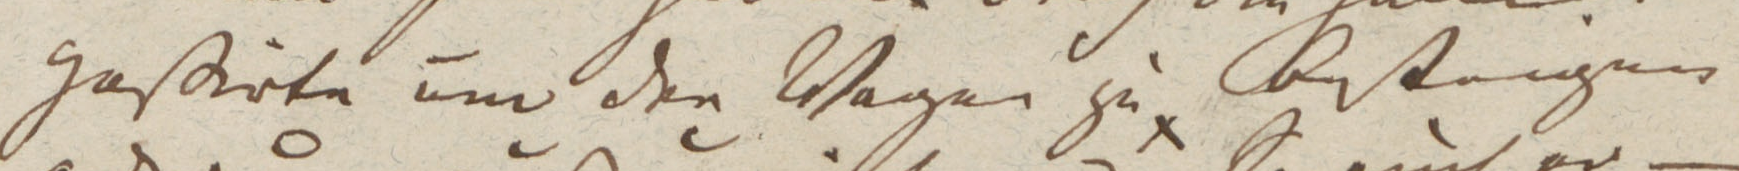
passirte um den Wagen zu besteigen
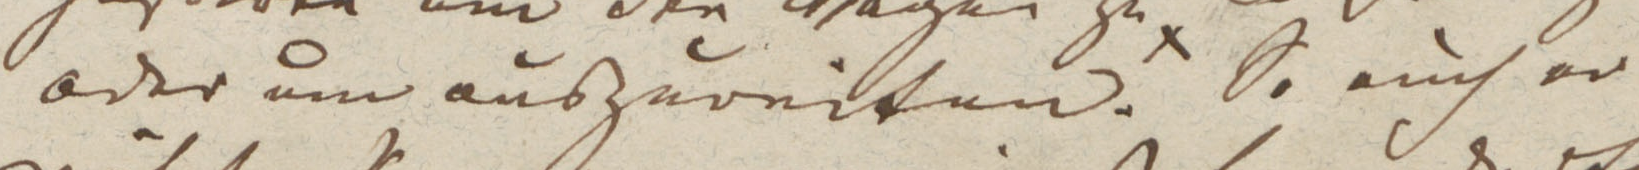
oder um auszureiten. % So auch er-
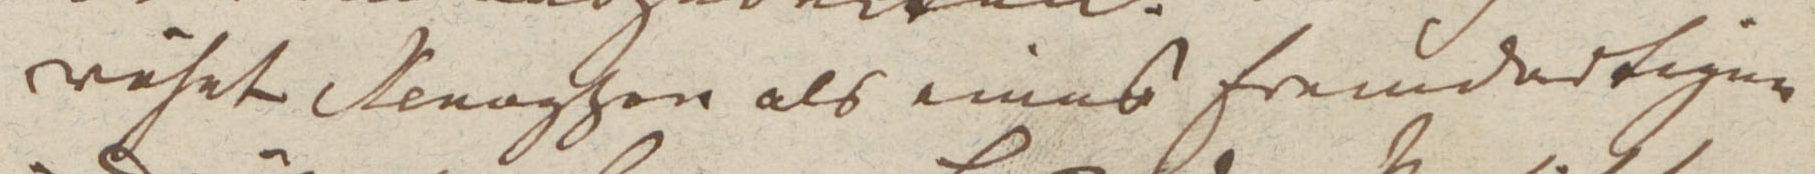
wähnt Xenophon als einers fremdartigen
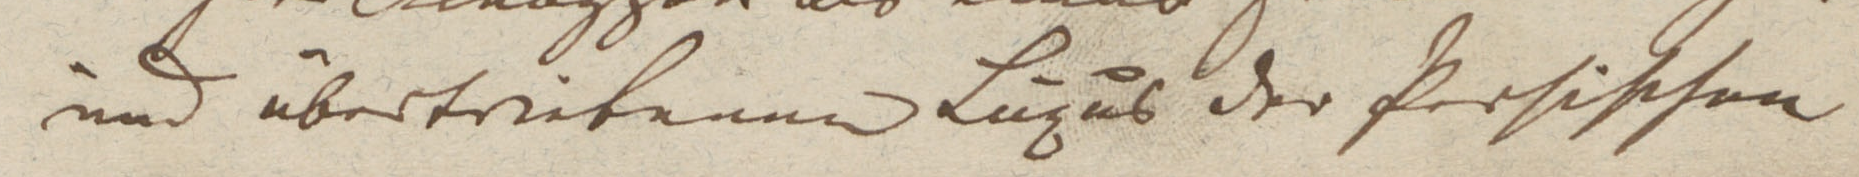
und übertriebenen Luxus der Persischen
